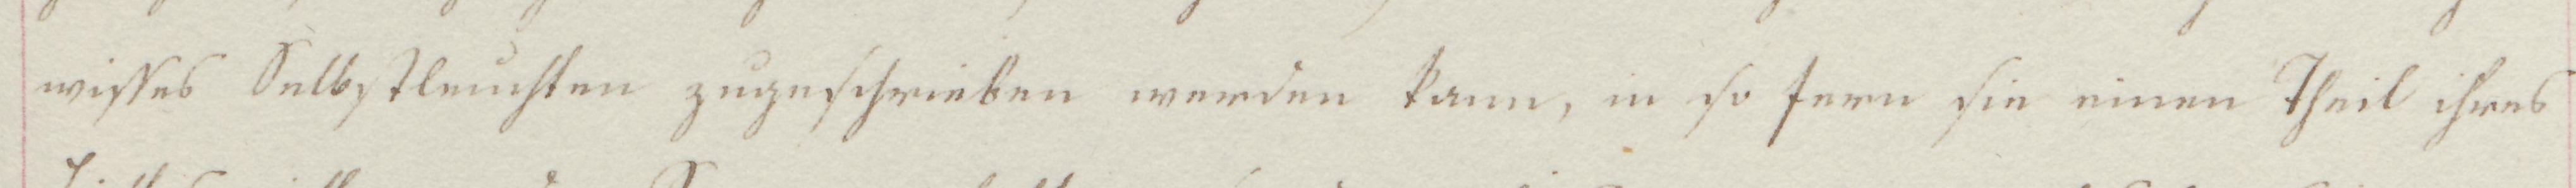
wisses Selbstleuchten zugeschrieben werden kann, in so fern sie einen Theil ihres
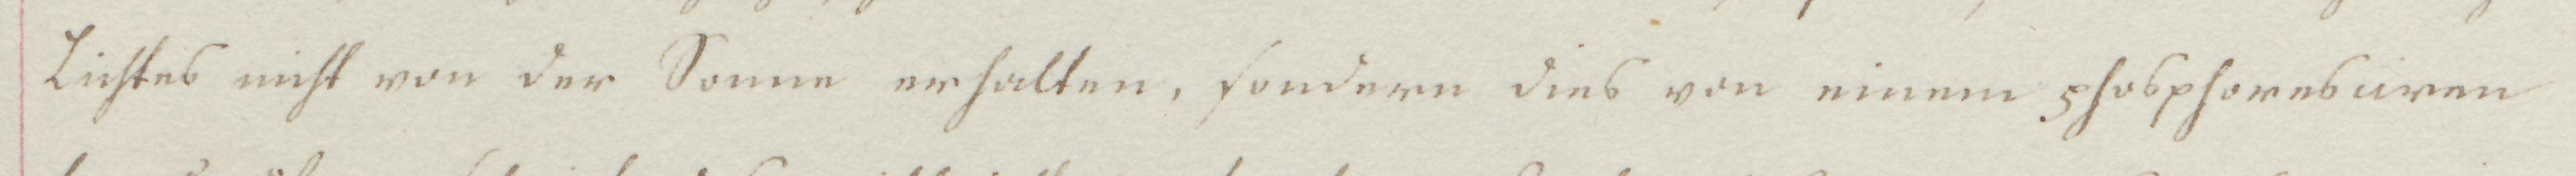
Lichtes nicht von der Sonne erhalten, sondern dies von einem phosphoresciren
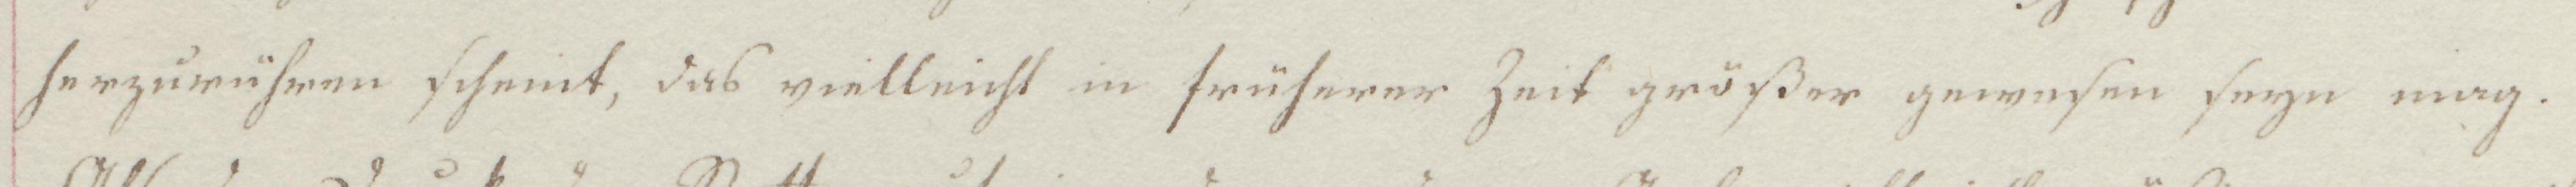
herzurühren scheint, das vielleicht in früherer Zeit größer gewesen seyn mag.
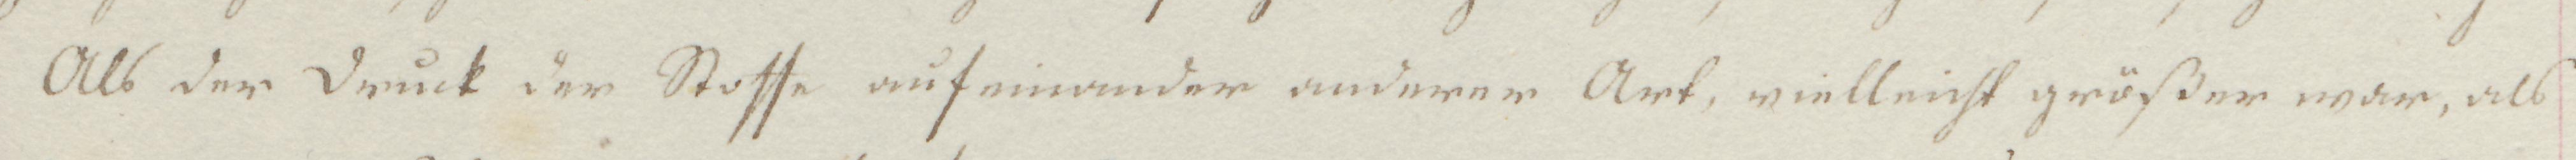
Als der Druck der Stoffe aufeinander anderer Art, vielleicht größer war, als
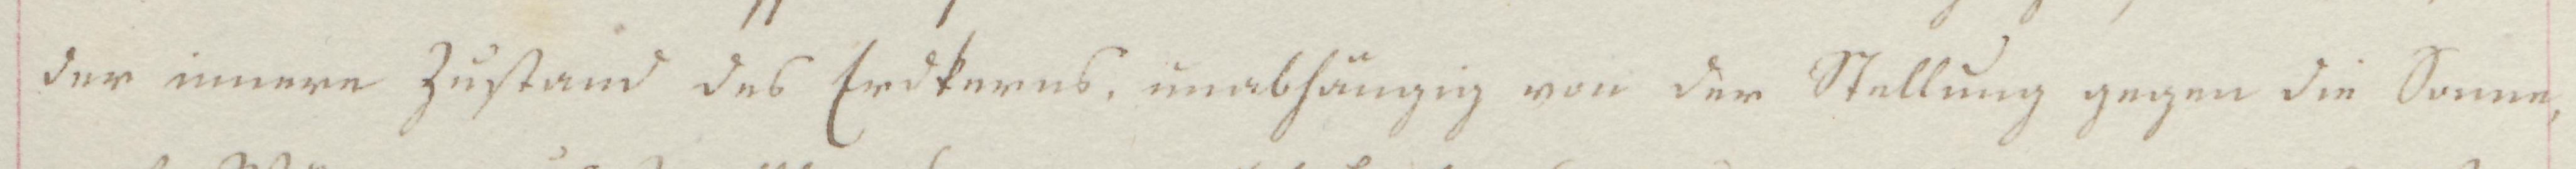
der innere Zustand des Erdkerns, unabhängig von der Stellung gegen die Sonne,
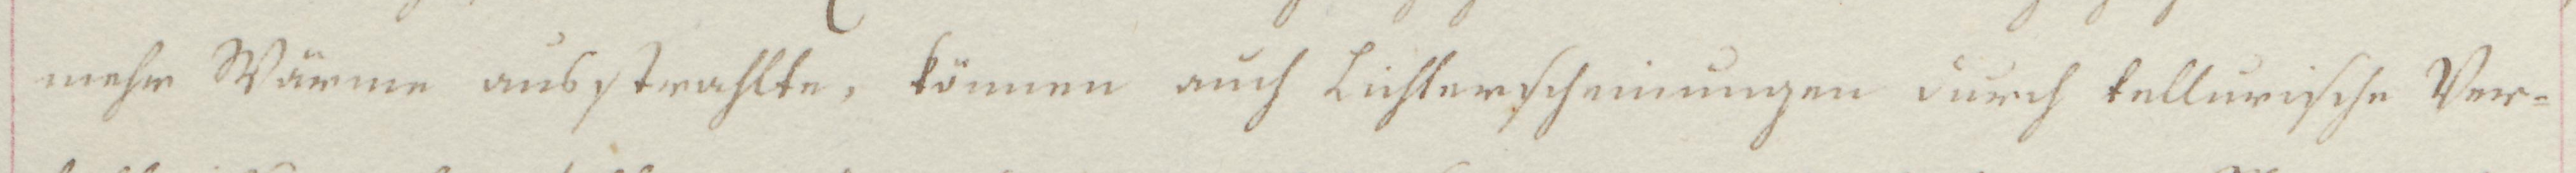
mehr Wärme ausstrahlte, können auch Lichterscheinungen durch tellurische Ver-
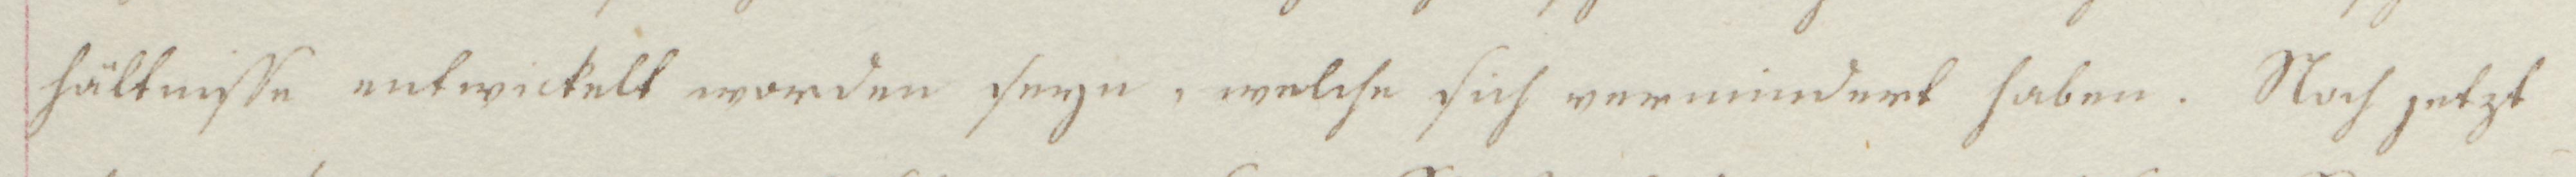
hältnisse entwickelt worden seyn, welche sich vermindert haben. Noch jetzt
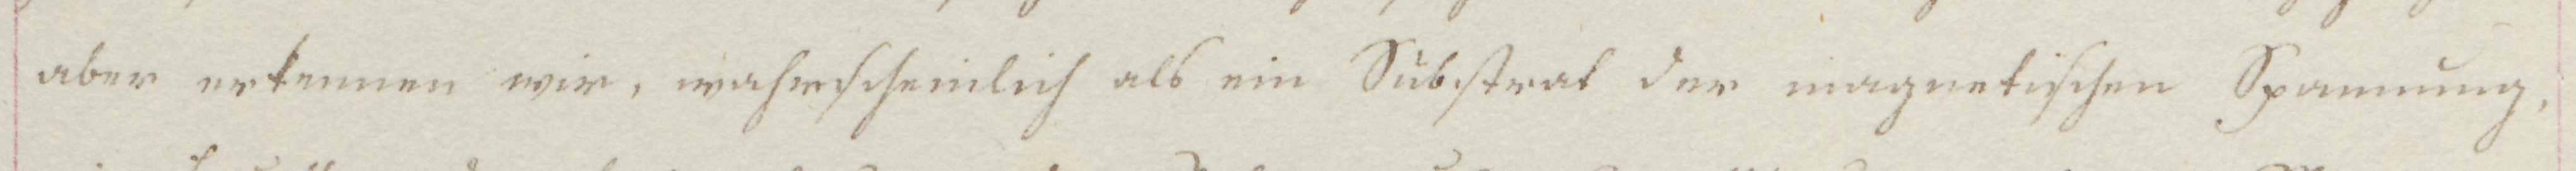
aber erkennen wir, wahrscheinlich als ein Substrat der magnetischen Spannung,
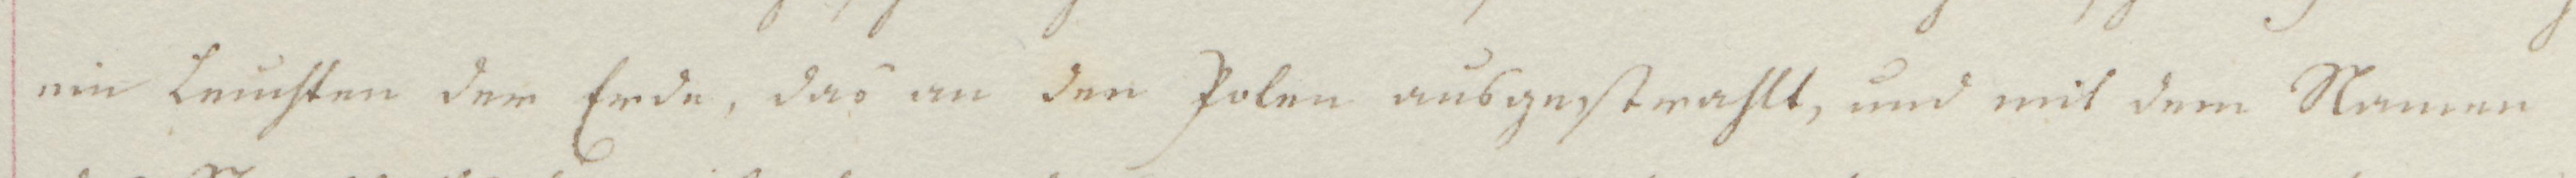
ein Leuchten der Erde, das an den Polen ausgestrahlt, und mit dem Namen
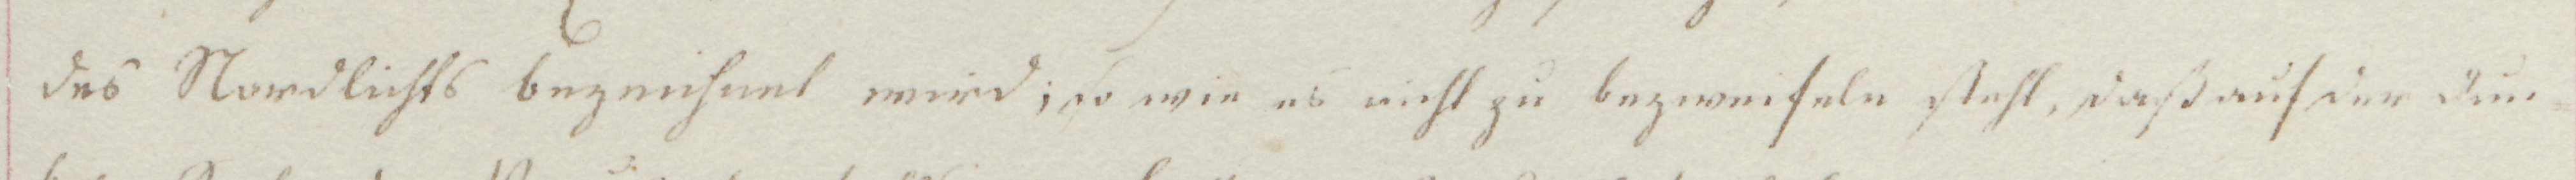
des Nordlichts bezeichnet wird; so wie es nicht zu bezweifeln steht, daß auf der dun-
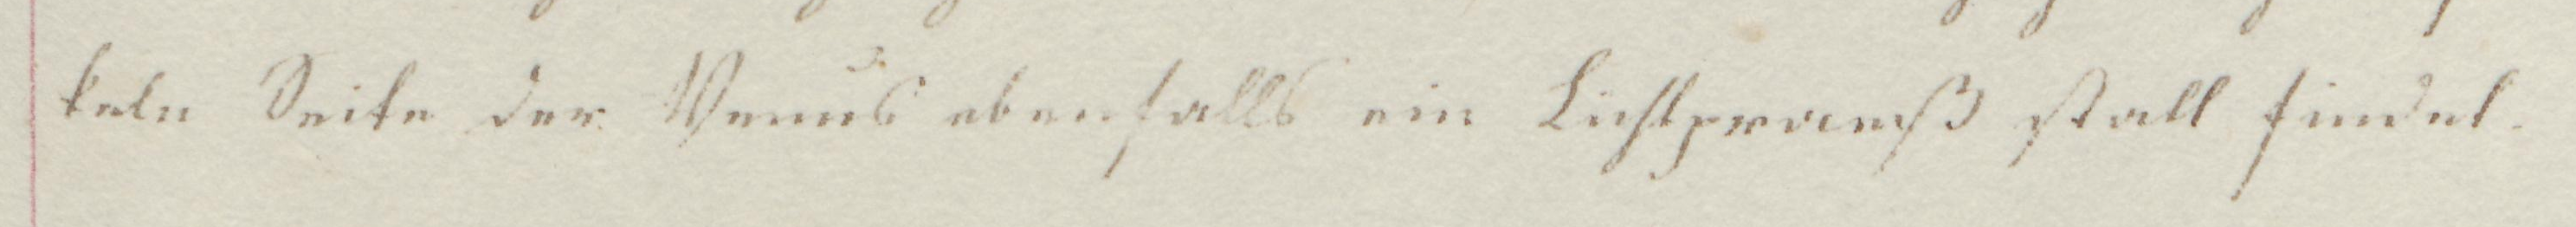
keln Seite der Venus ebenfalls ein Lichtproceß statt findet.
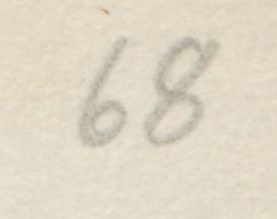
Erde.
